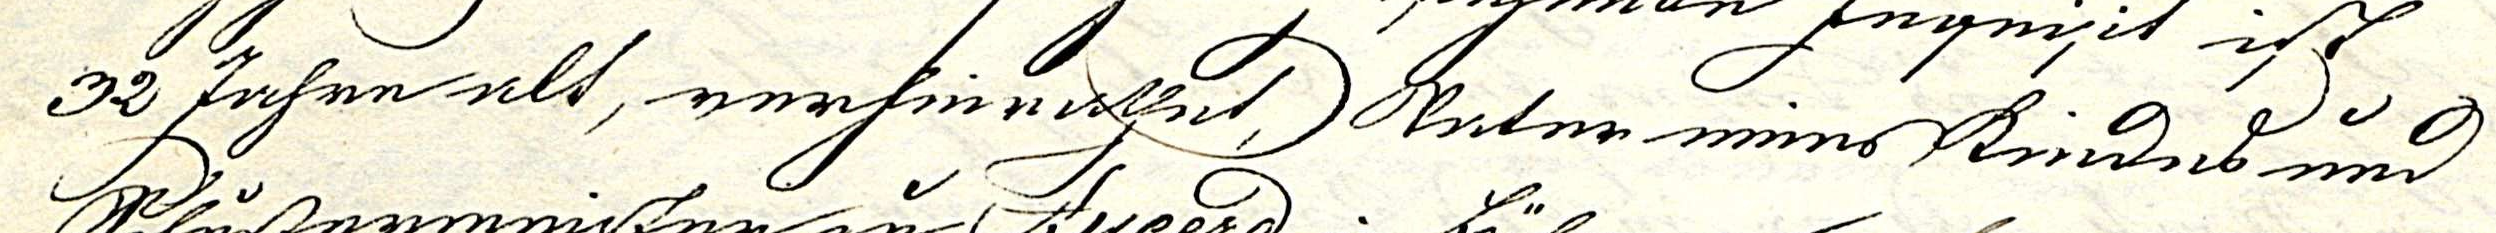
32 Jahre alt, verheirathet, Vater eines Kindes und
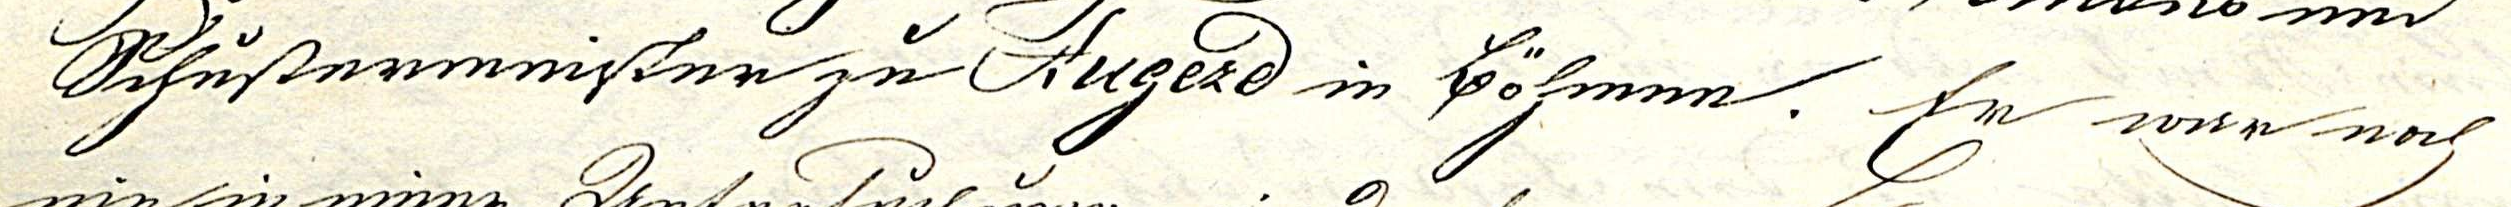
Schustermeister zu Augezd in Böhmen. Er war noch
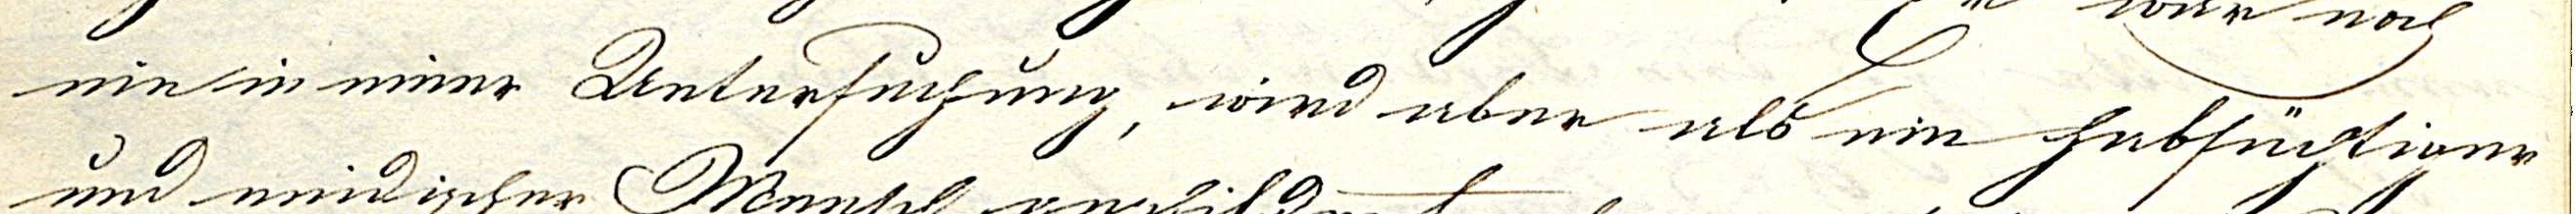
nie in einer Untersuchung, wird aber als ein habsüchtiger
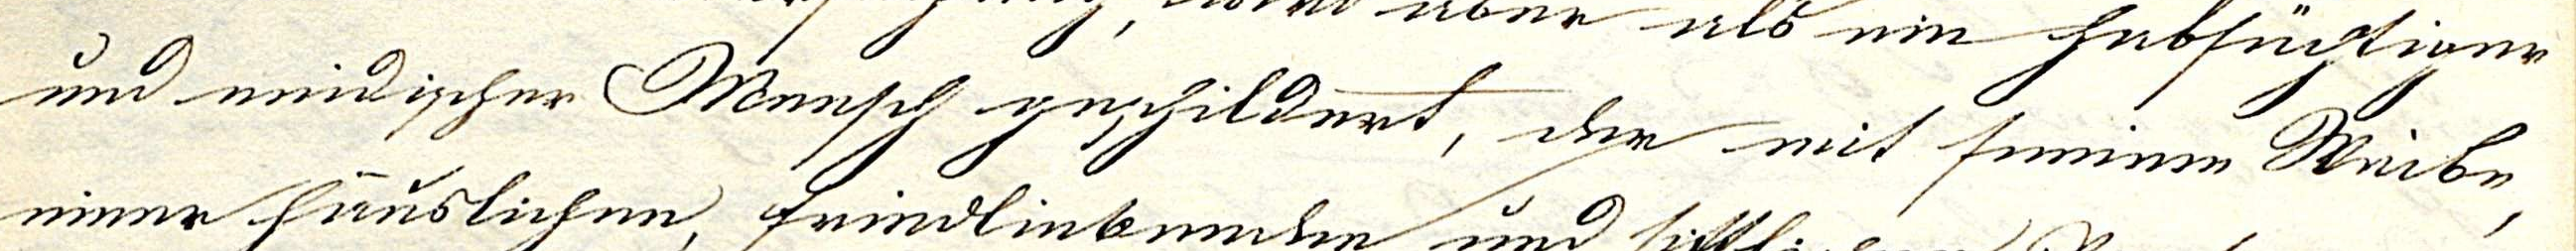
und neidischer Mensch geschildert, der mit seinem Weibe,
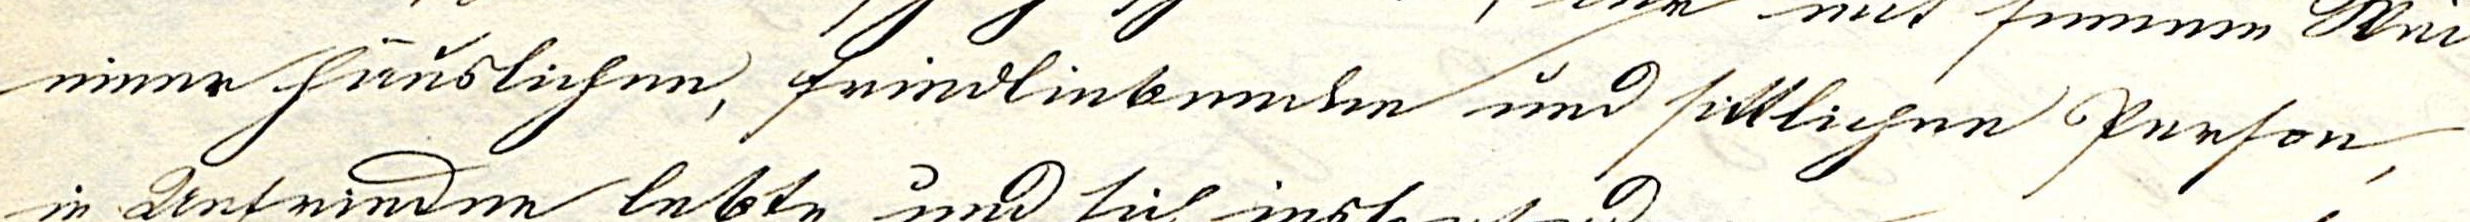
einer häuslichen, friedliebenden und sittlichen Person,
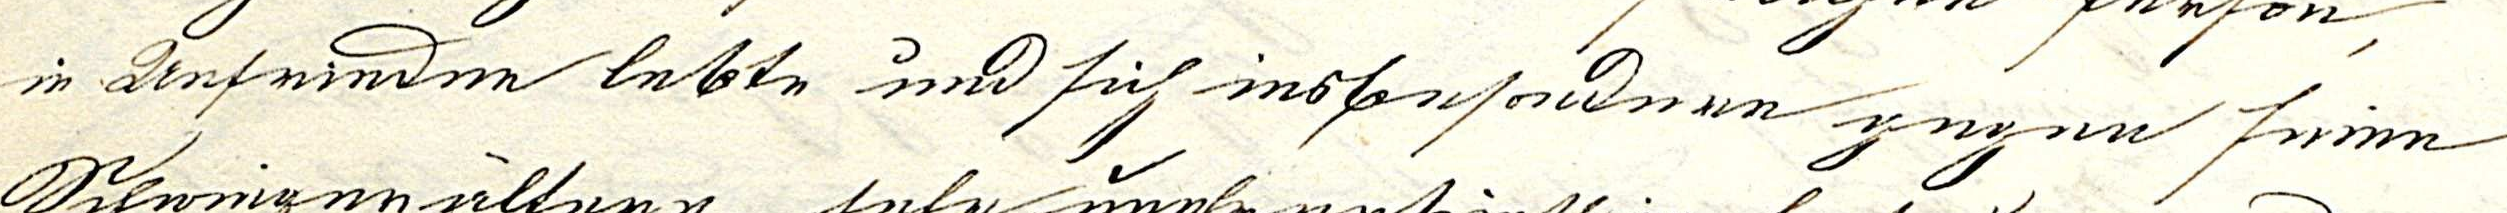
in Unfrieden lebte und sich insbesondere gegen seine
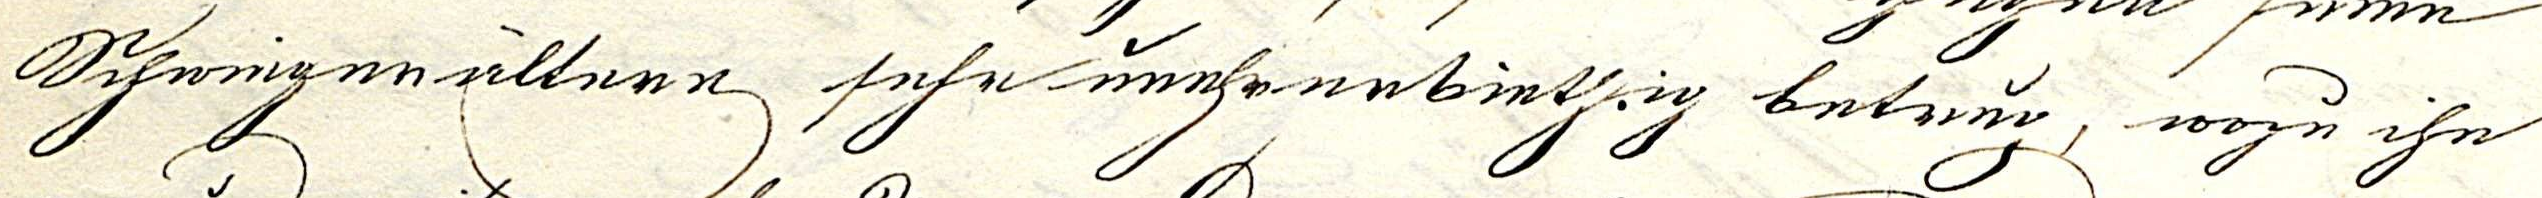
Schwiegerältern sehr unehrerbiethig betrug, wozu ihn
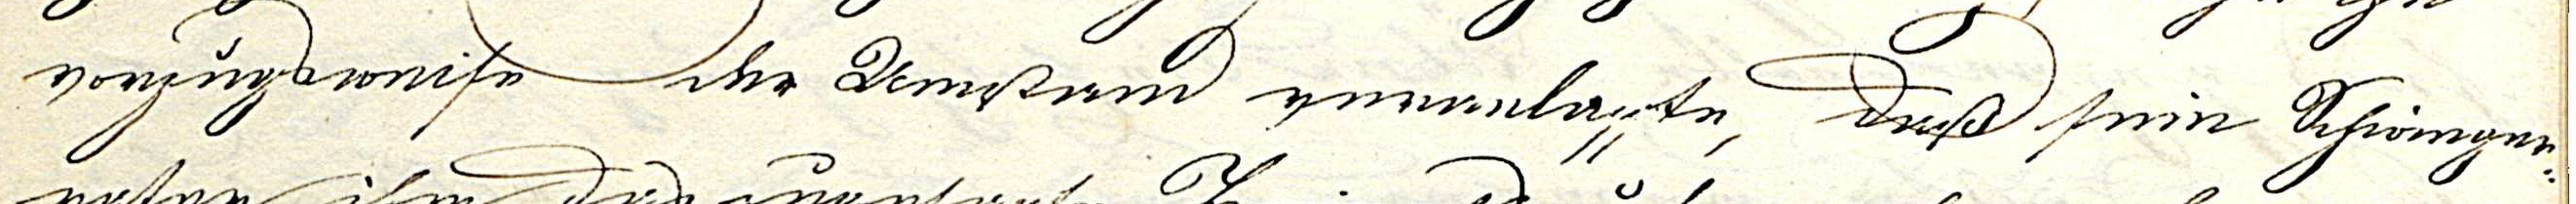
vorzugsweise der Umstand veranlasste, daß sein Schwieger¬
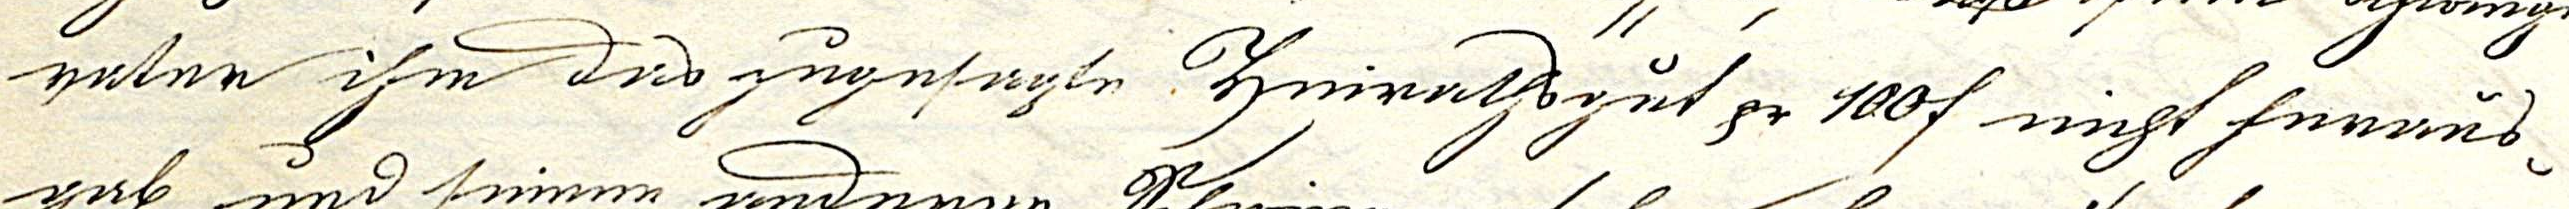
vater ihm das zugesagte Heirathsgut pr 100f nicht heraus¬
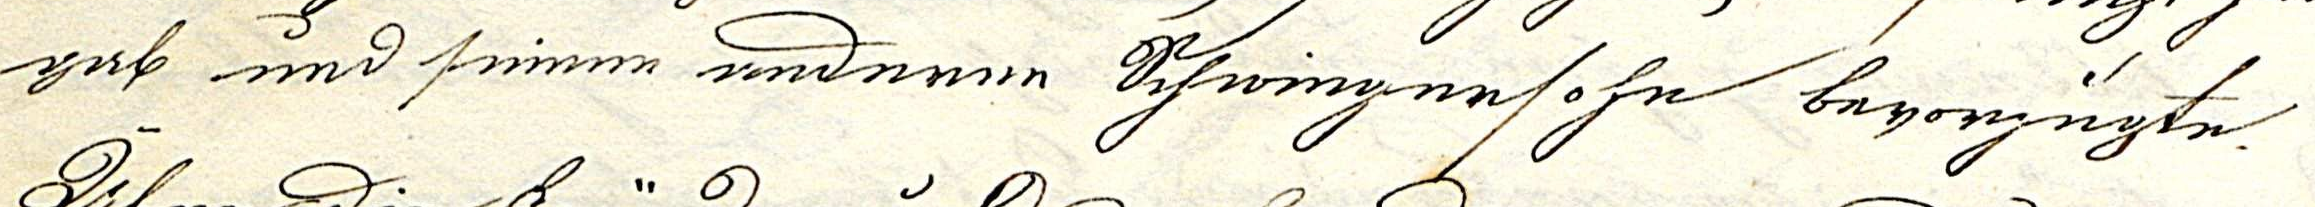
gab und seine anderen Schiwegersohn bevorzügte.
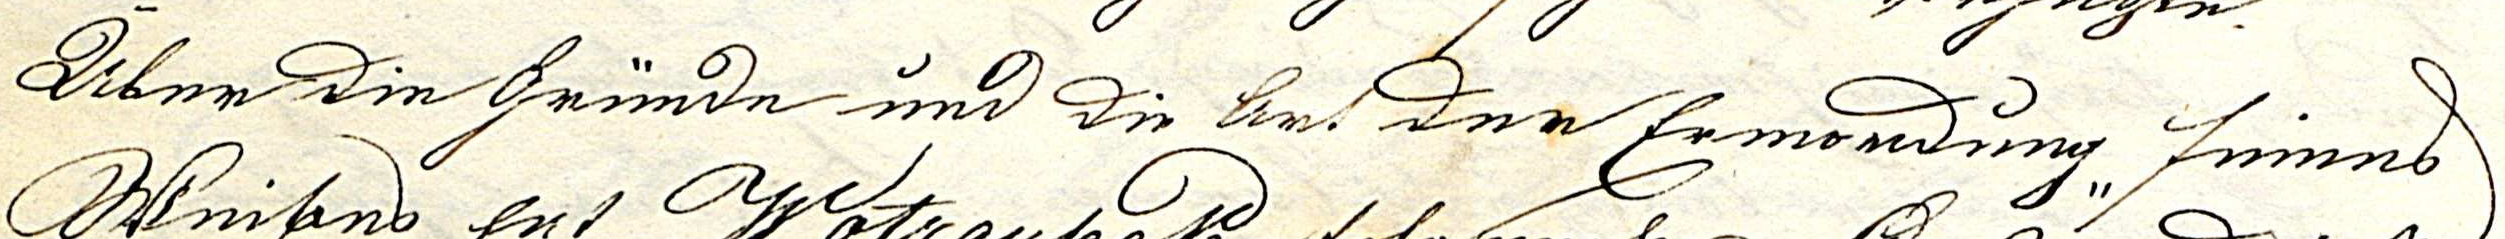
Über die Gründe und die Art der Ermordung seines
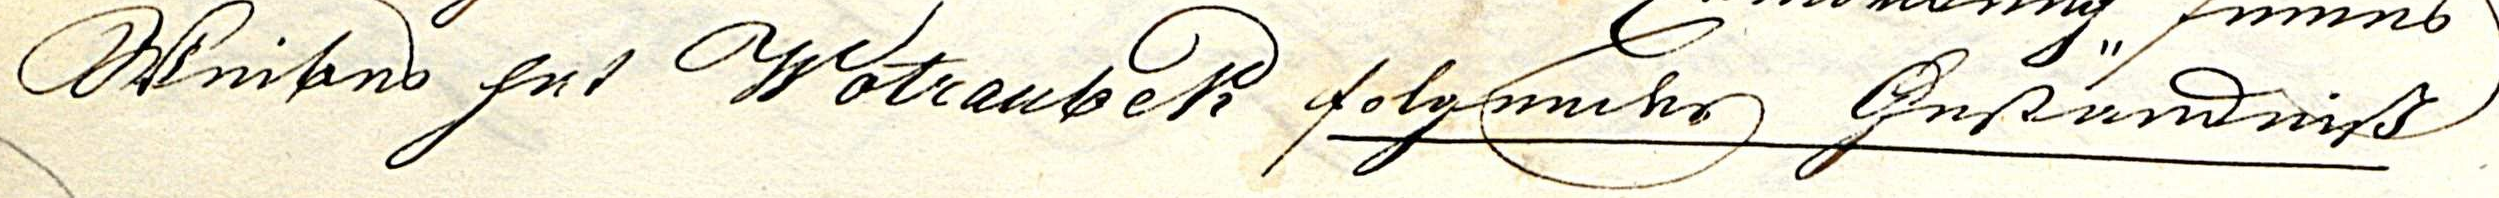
Weibes hat Wotraubek folgendes Geständniß
